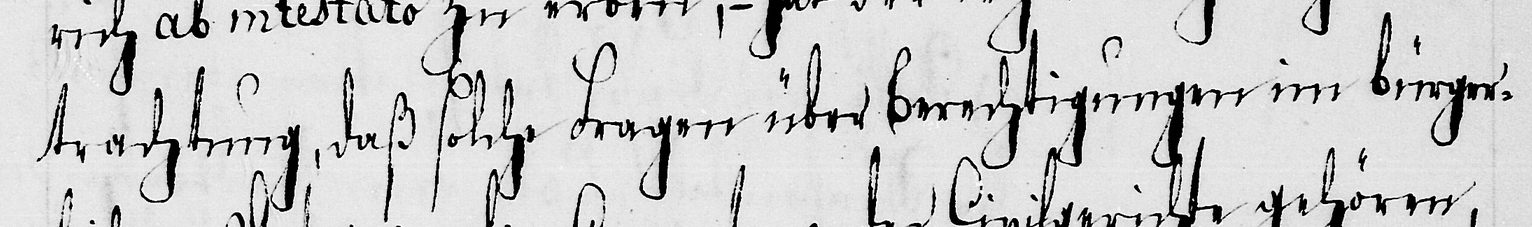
trachtung, daß solche Fragen über Berechtigungen im bürger¬
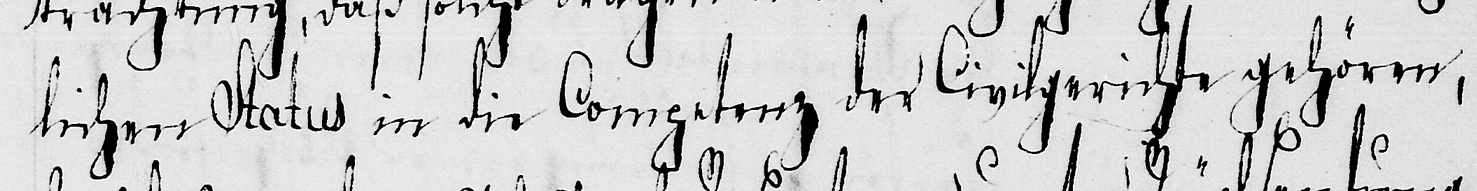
lichen Status in die Competenz der Civilgerichte gehören,
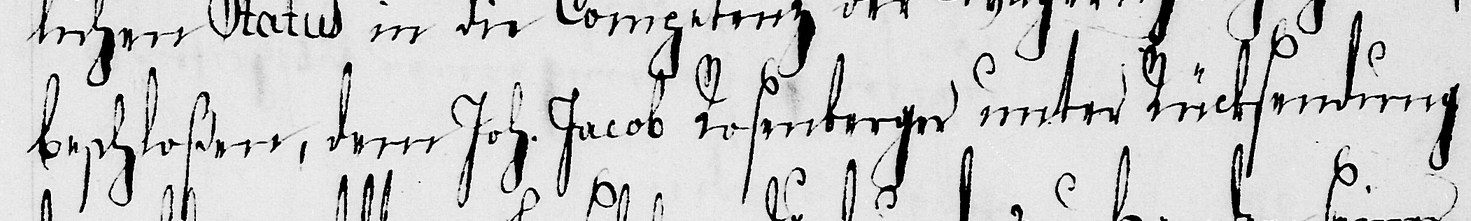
beschloßen, dem Joh. Jacob Rosenberger unter Rückforderung
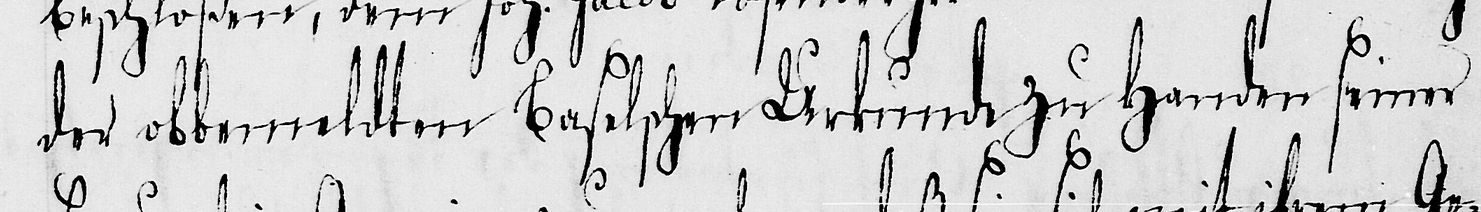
der obbemeldten Baselschen Urkunde zu Handen seiner
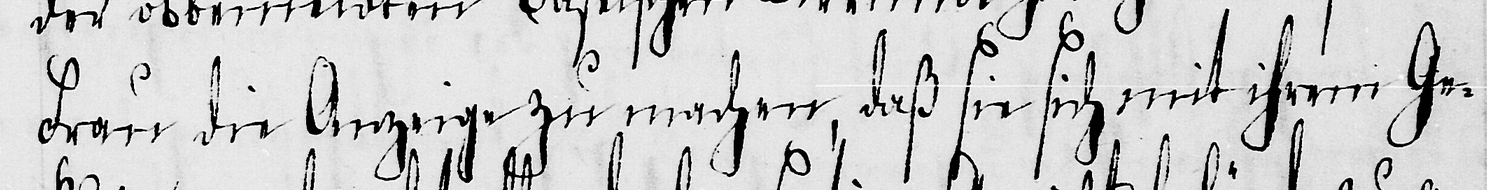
Frau die Anzeige zu machen, daß sie sich mit ihrem Ge¬
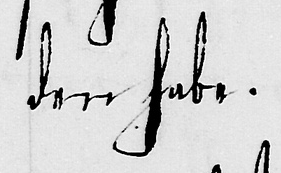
den habe.
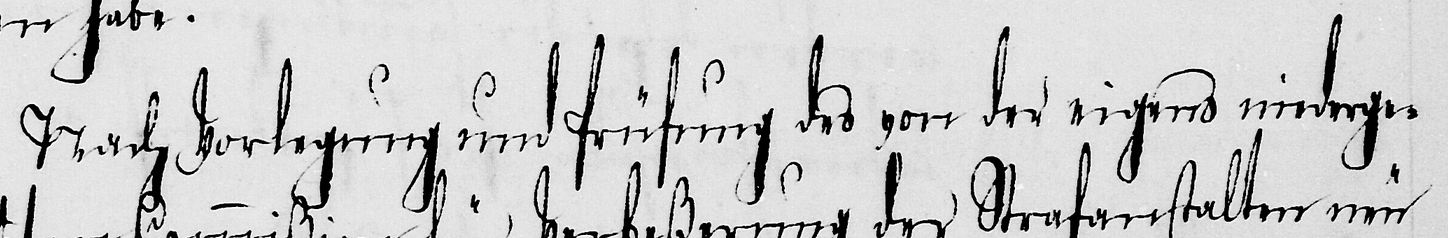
Nach Vorlegung und Prüfung des von der eigens nieder¬
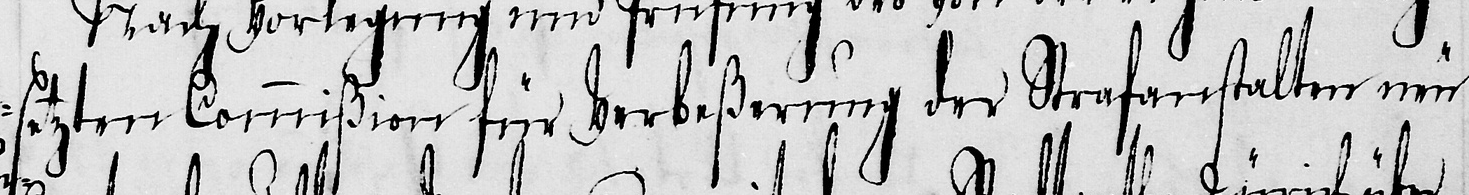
setzten Commißion für Verbeßerung der Strafanstalten neu
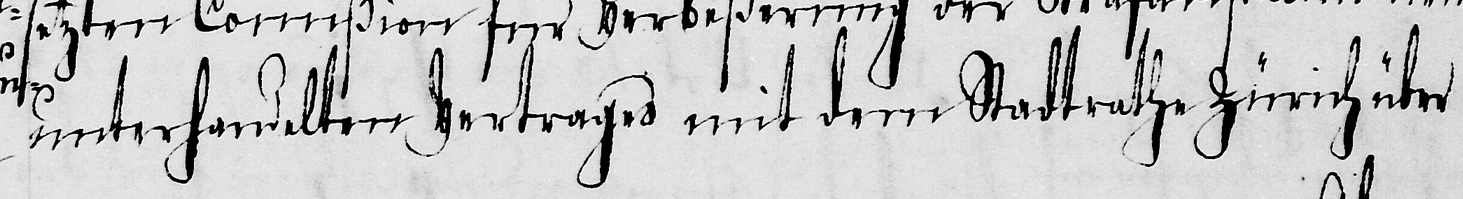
unterhandelten Vertrages mit dem Stadtrathe Zürich über
